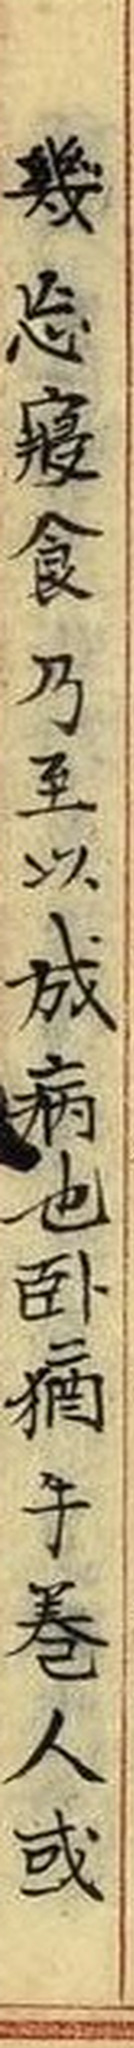幾忘寝食乃至以成病也臥猶手巻人或
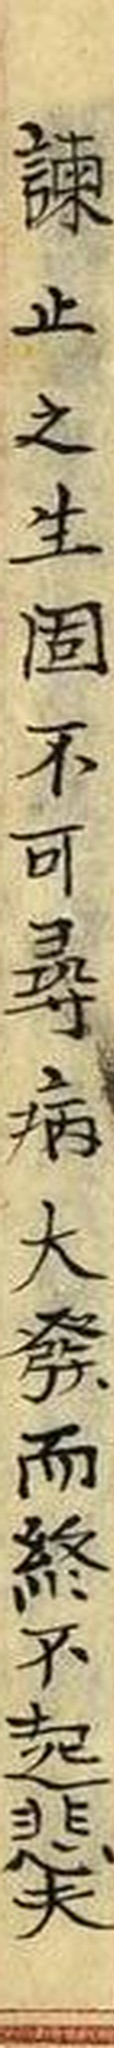諫止之生固不可尋病大発而終不起悲夫
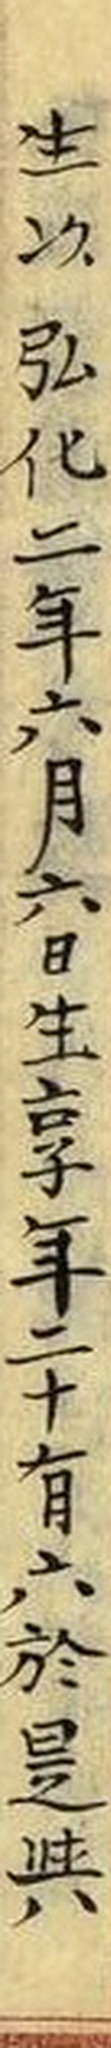生以弘化二年六月六日生享年二十有六於是与
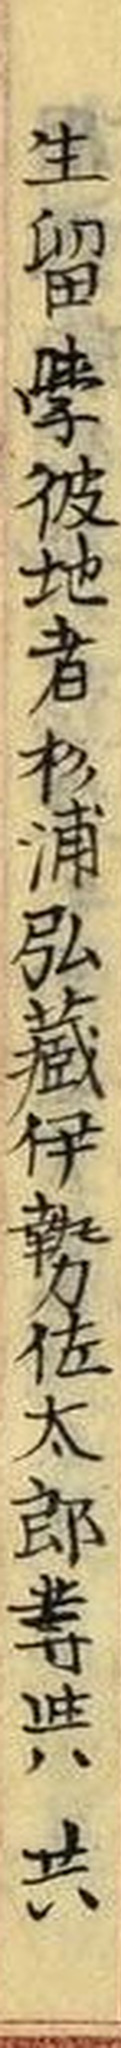生留学彼地者杉浦弘蔵伊勢佐太郎等与共

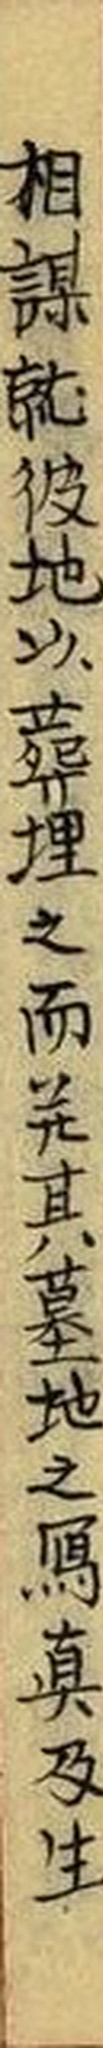相謀就彼地以葬埋之而并其墓地之写真及生
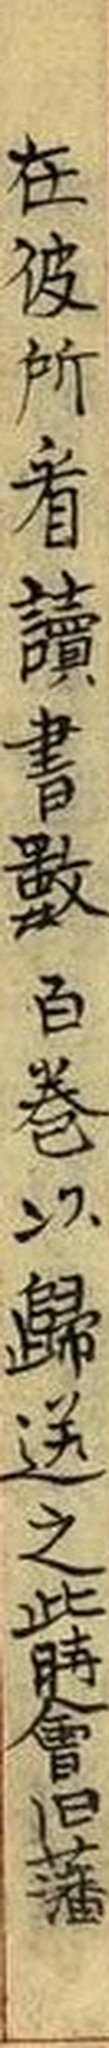在彼所看読書数百巻以帰送之此時会旧藩
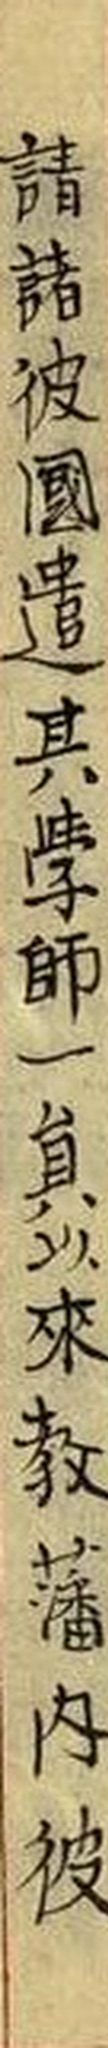請諸彼国遣其学師一員以来教藩内彼
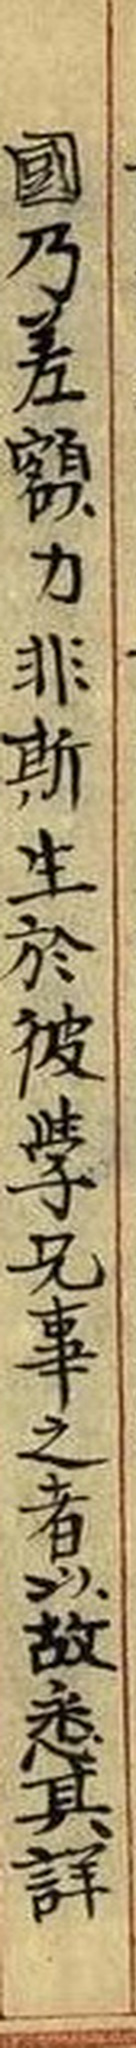国乃差額力非斯生於彼学兄事之者以故悉其詳
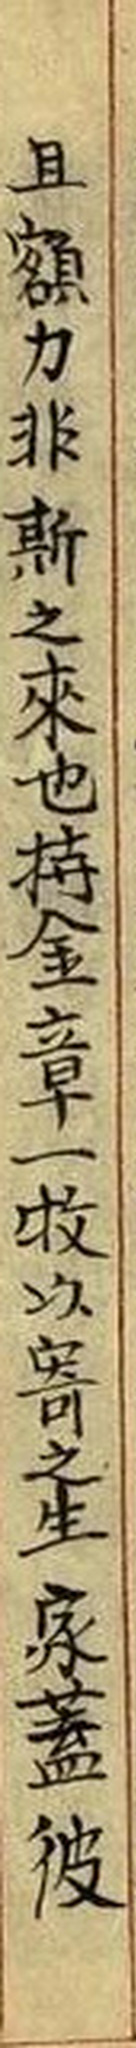且額力非斯之来也持金章一牧以寄之生家蓋彼
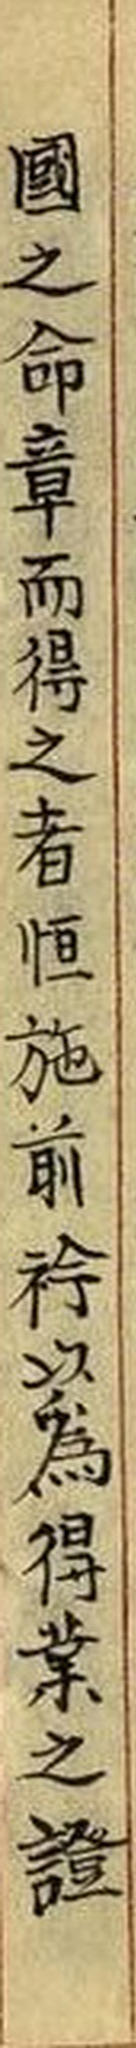国之命章而得之者恒施前衿以為得業之証
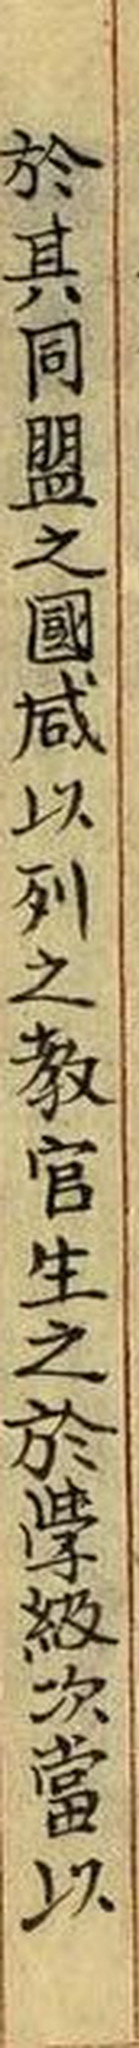於其同盟之国咸以列之教官生之於学級次当以
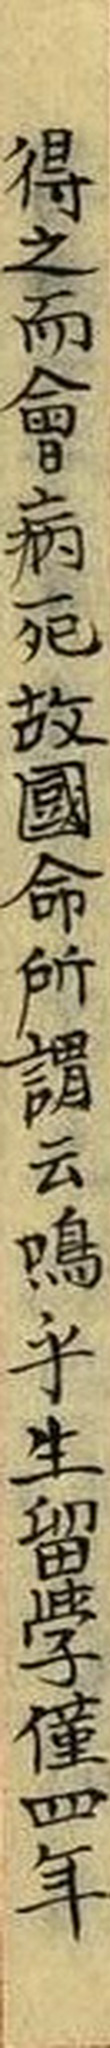得之而会病死故国命所謂云嗚乎生留学僅四年
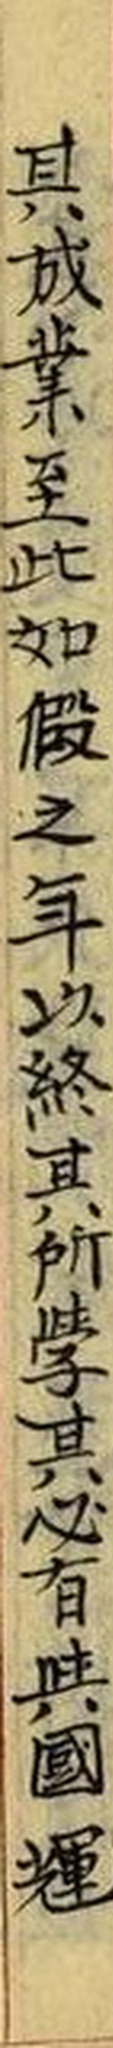其成業至此如仮之年以終其所学其必有與国輝
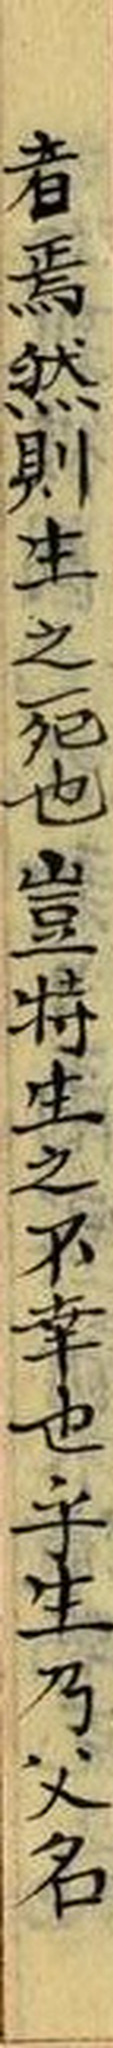者焉然則生之死也豈特生之不幸也乎生乃父名
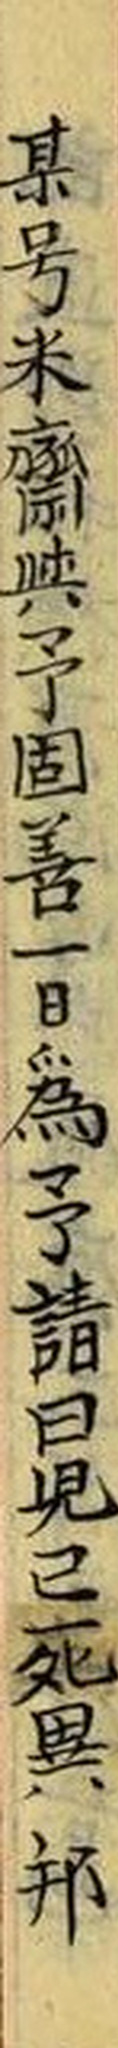某号米斎与予固善一日為予請曰児已死異邦
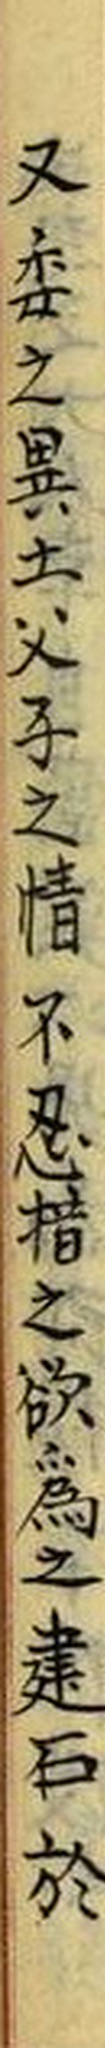又委之異土父子之情不忍措之欲為之建石於
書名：温古集 三巻
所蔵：福井県文書館 Fukui Prefectural Archives
